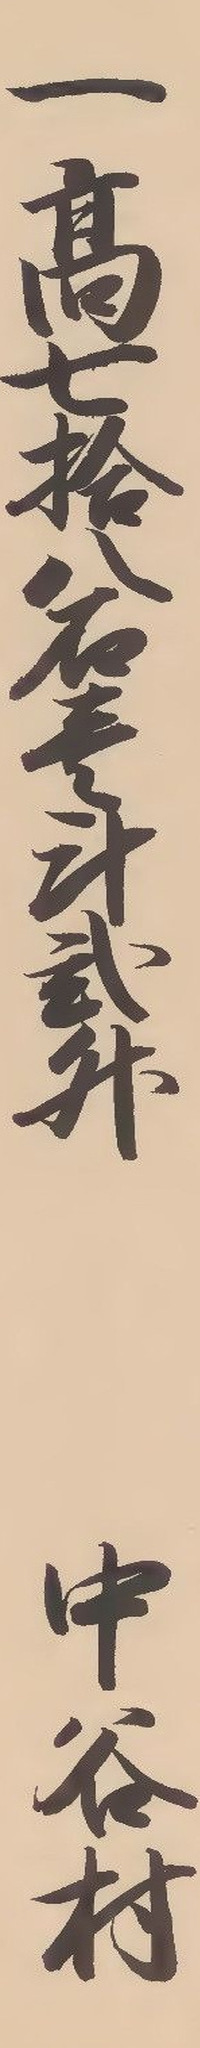一高七拾八石壱斗弐升中谷村
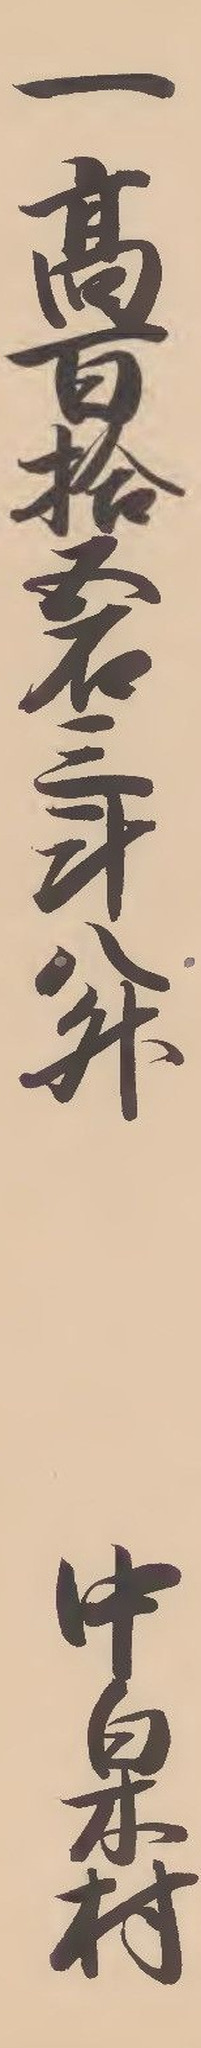一高百拾五石三斗八升中泉村

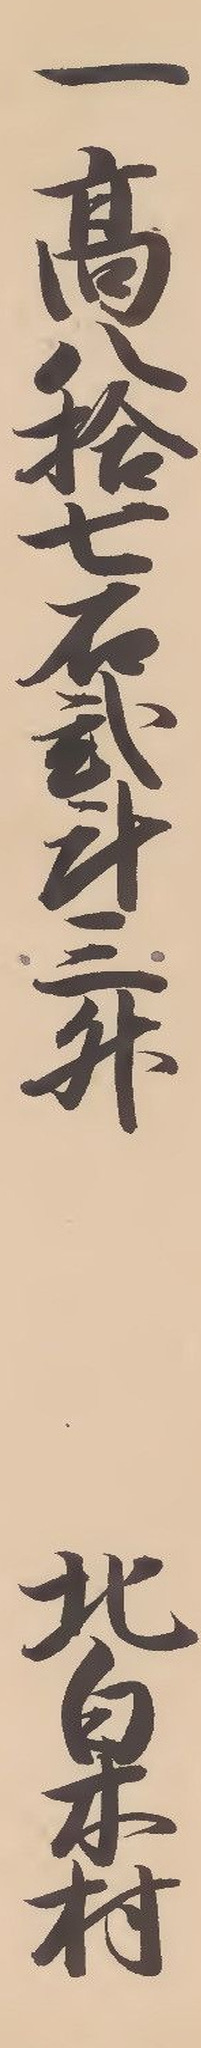一高八拾七石弐斗三升北泉村
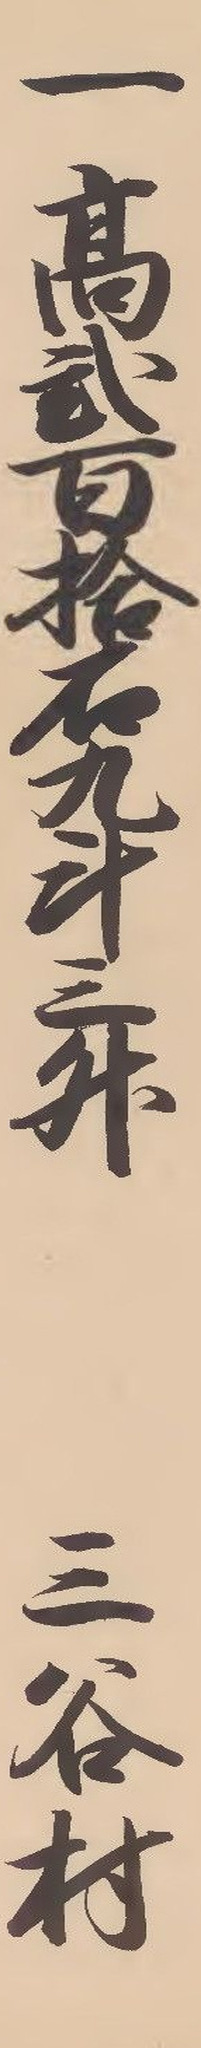一高弐百拾石九斗三升三谷村
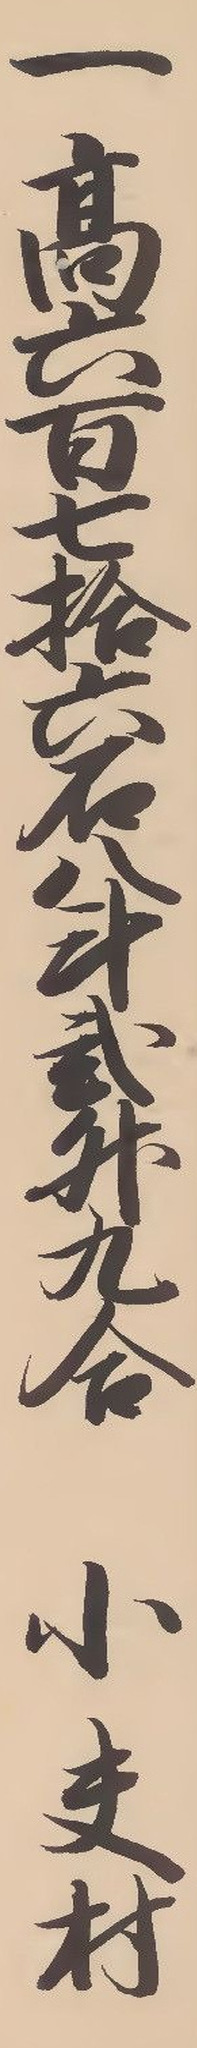一高六百七拾六石八斗弐升九合小夫村
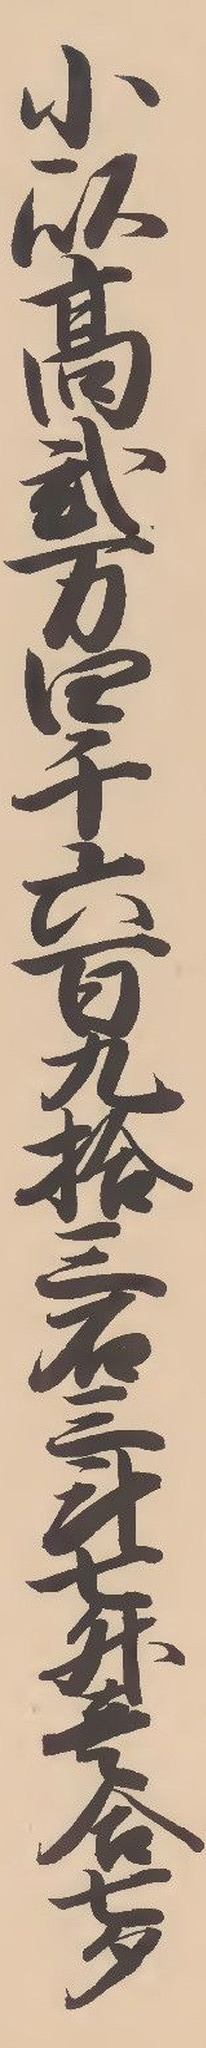小以高弐万四千六百九拾三石三斗七升壱合七勺

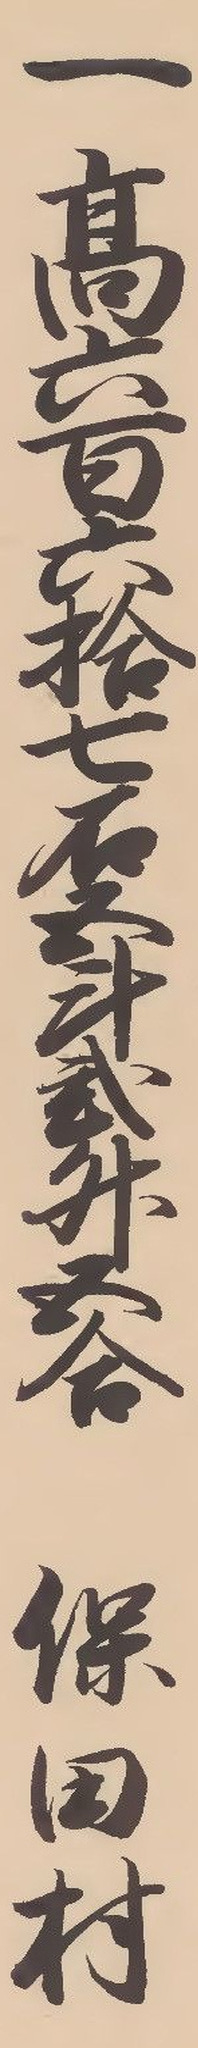一高六百六拾七石五斗弐升五合保田村
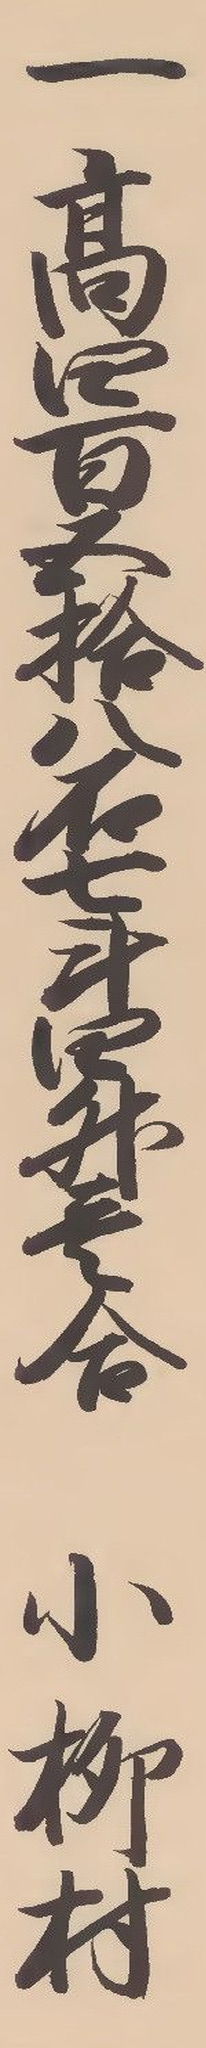一高四百五拾八石七斗四升壱合小柳村
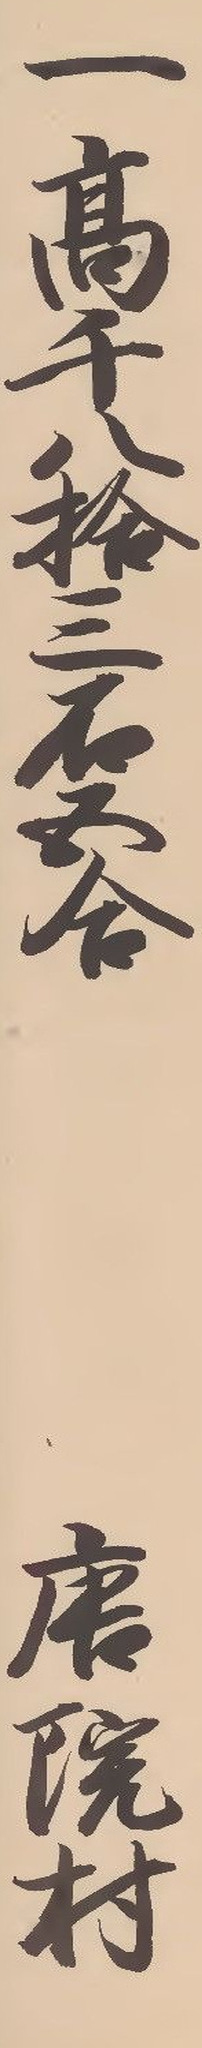一高千八拾三石五合唐院村
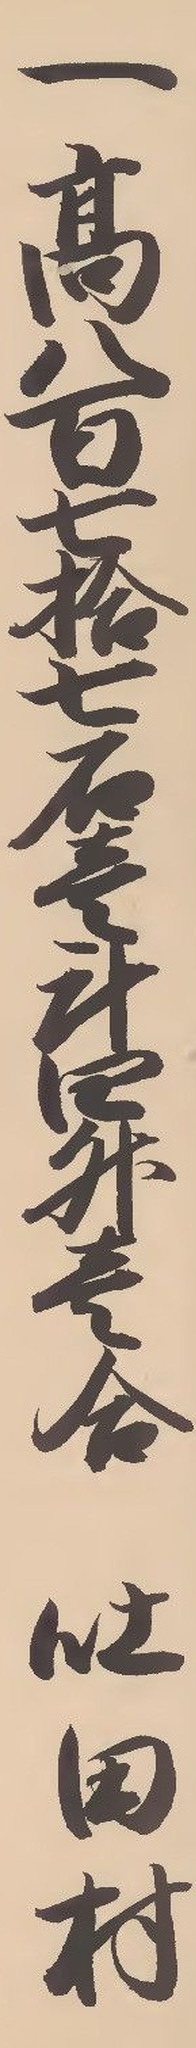一高八百七拾七石壱斗四升壱合吐田村
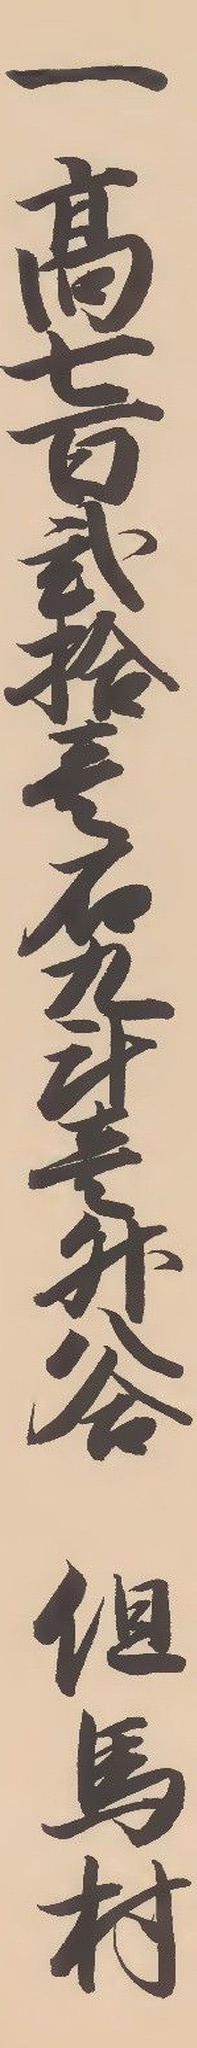一高七百弐拾壱石九斗壱升八合但馬村
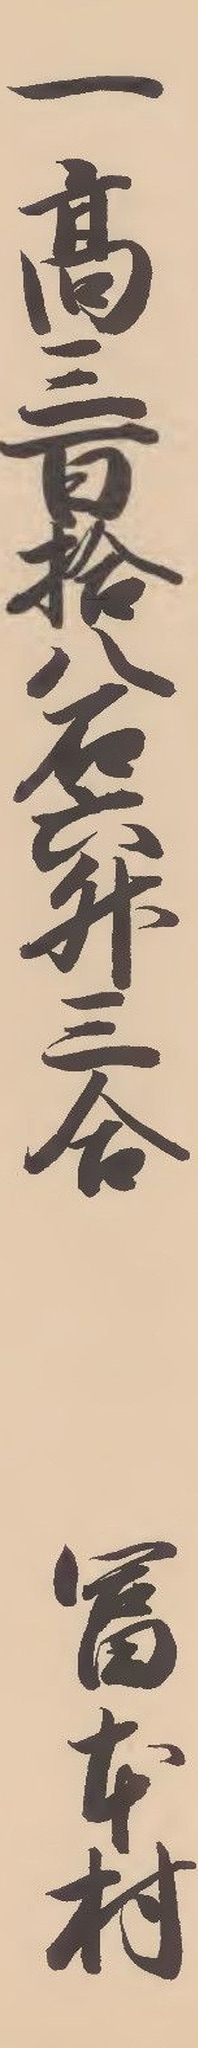一高三百拾八石六升三合富本村
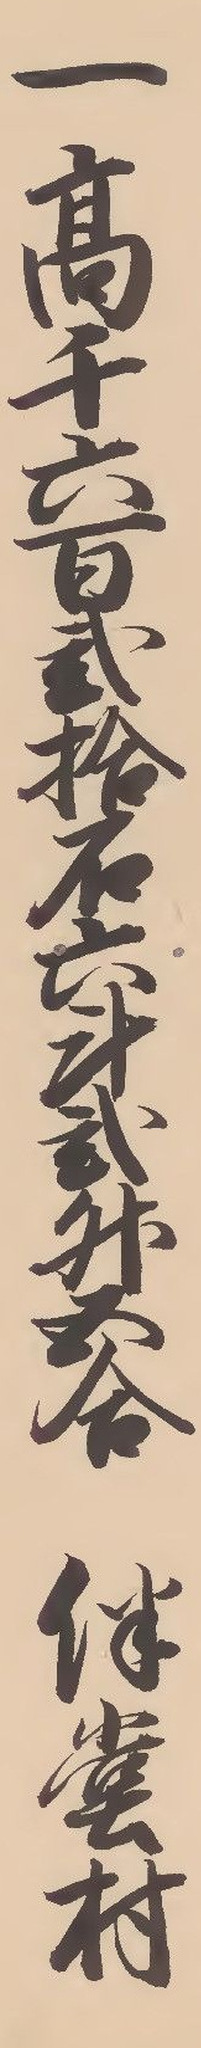一高千六百弐拾石六斗弐升五合伴堂村

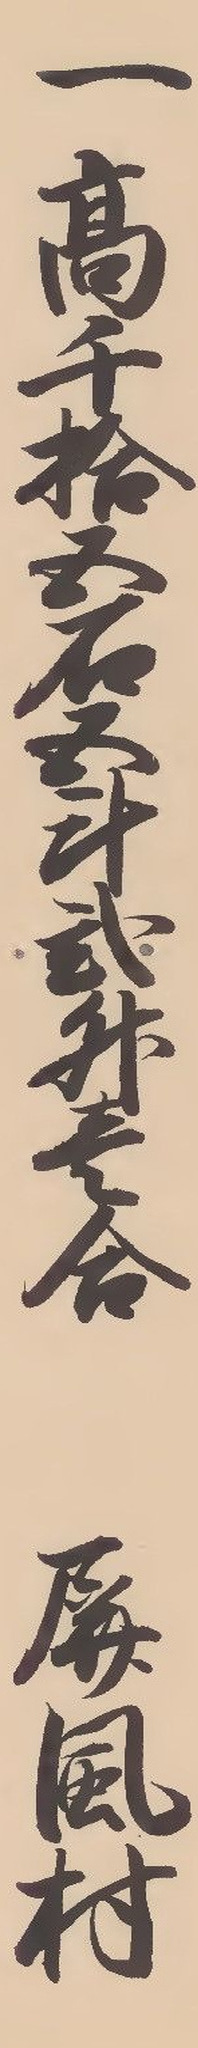一高千拾五石五斗弐升壱合屏風村
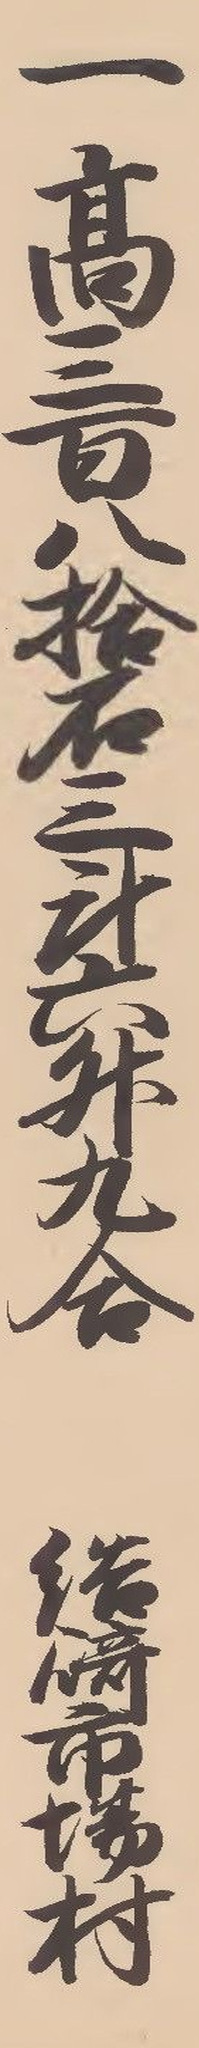一高三百八拾石三斗六升九合結崎市場村
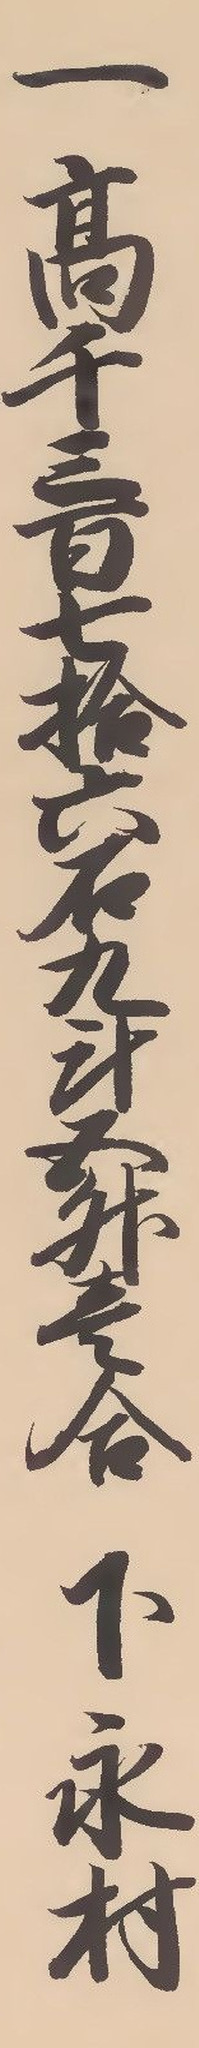一高千三百七拾六石九斗五升壱合下永村
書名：大和国郷帳
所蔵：国立公文書館 National Archives of Japan
